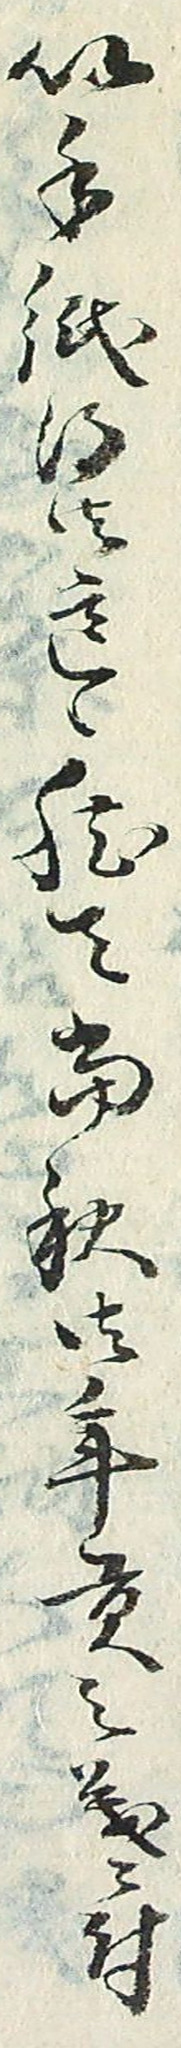以手紙得御意候然者當秋御年貢之義ニ付
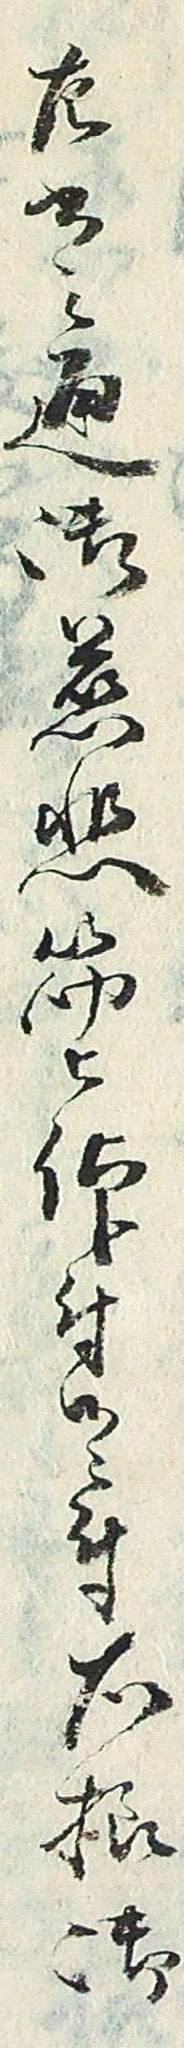左書之通御慈悲筋被仰付候ニ付右様御
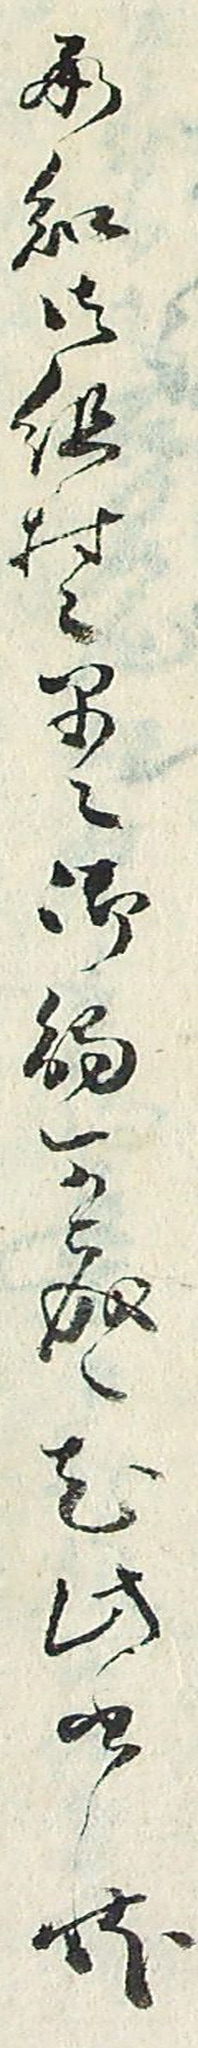承知御組村々早々御觸可被成候尤此書状
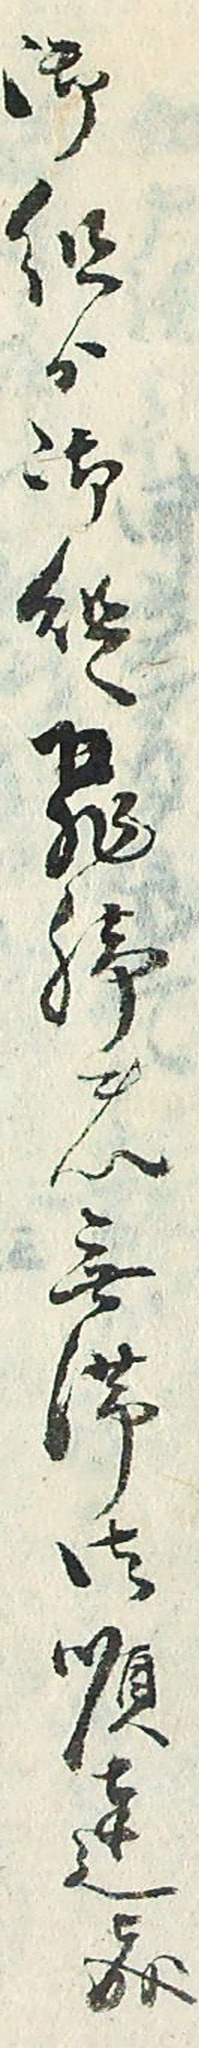御組ゟ御組へ飛脚ヲ以無滞御順達被成
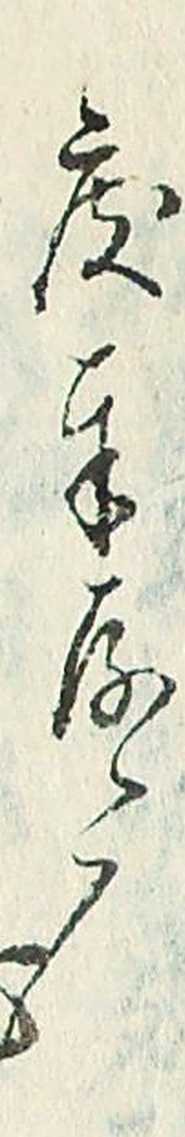度奉存候以上
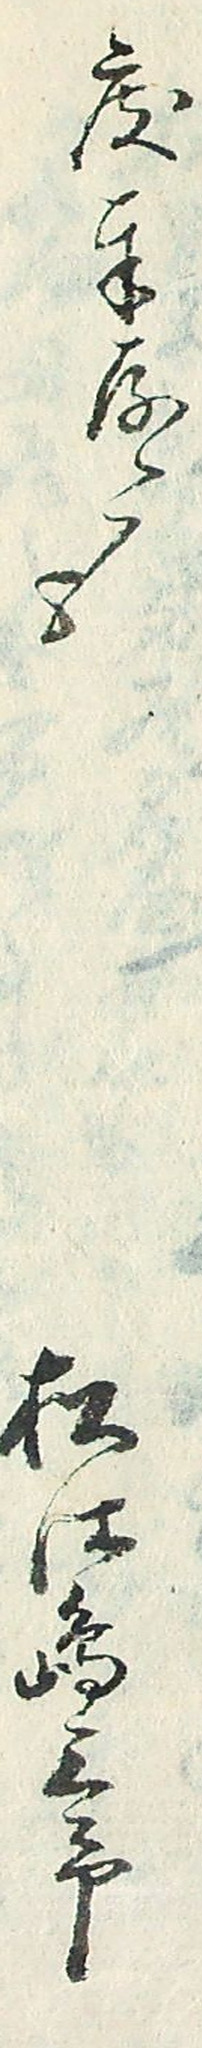度奉存候以上
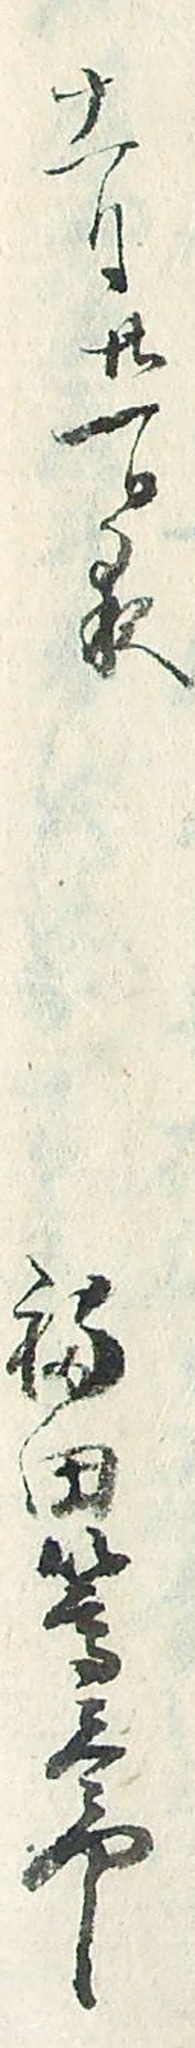十一月廿一日夜松江嶋三郎
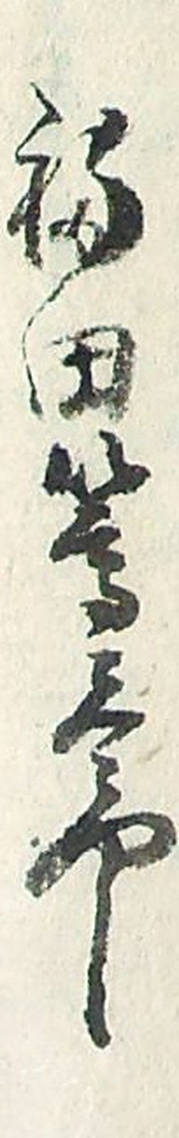福田篤三郎

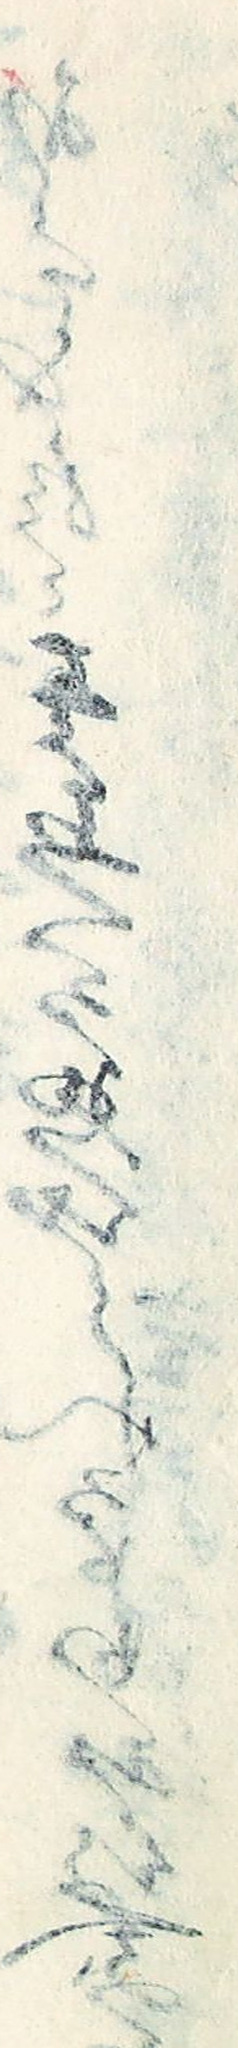申十一月廿一日
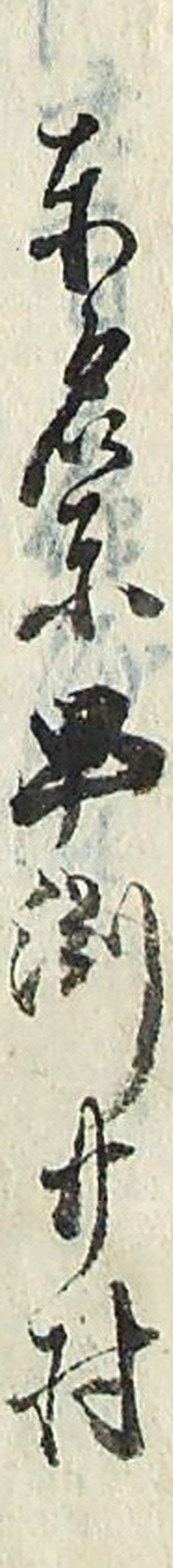東名東早渕中村
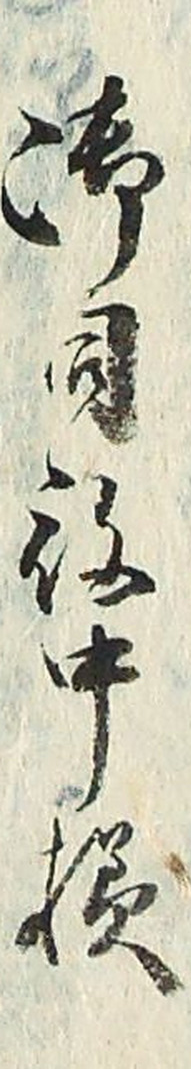御同役中様
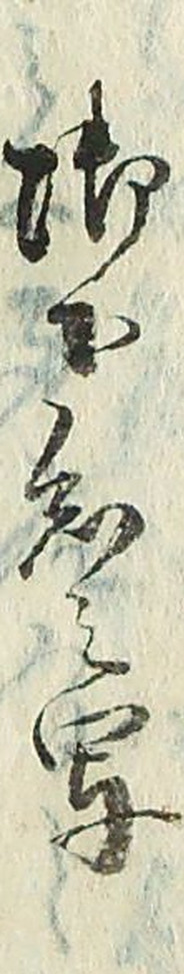御下知之写
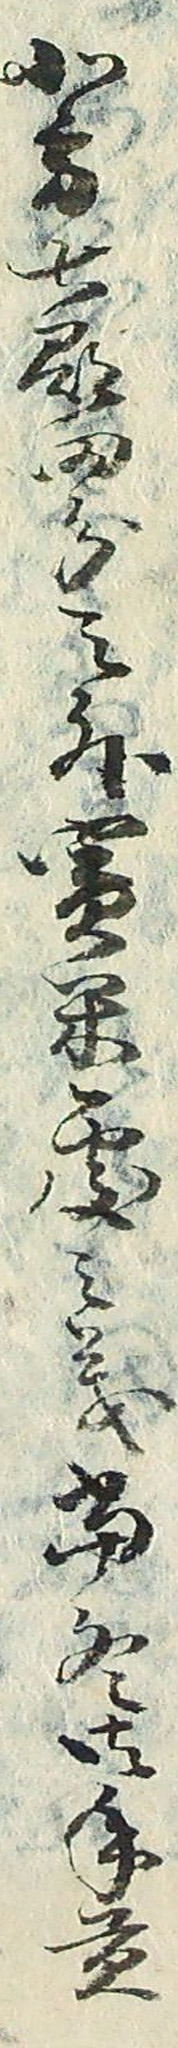北方七郡田分之外買米處之義當冬御年貢
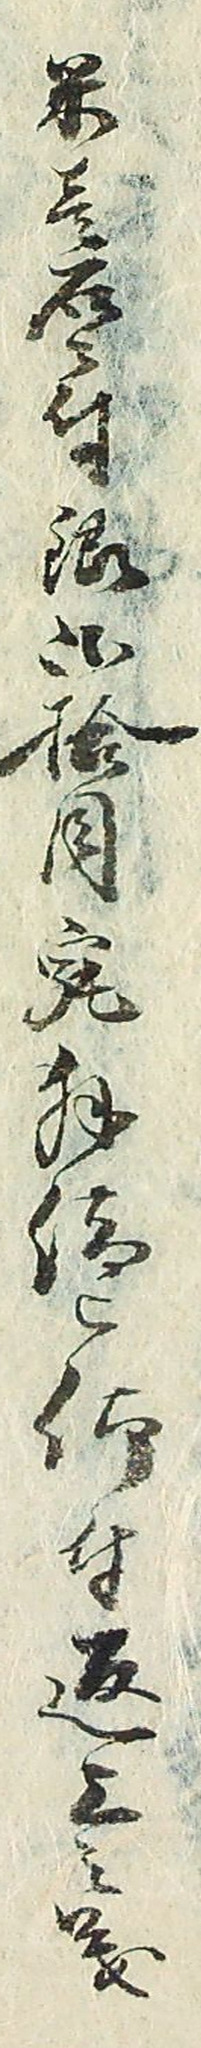米壱石ニ付銀弐拾目宛拝借被仰付返上之義
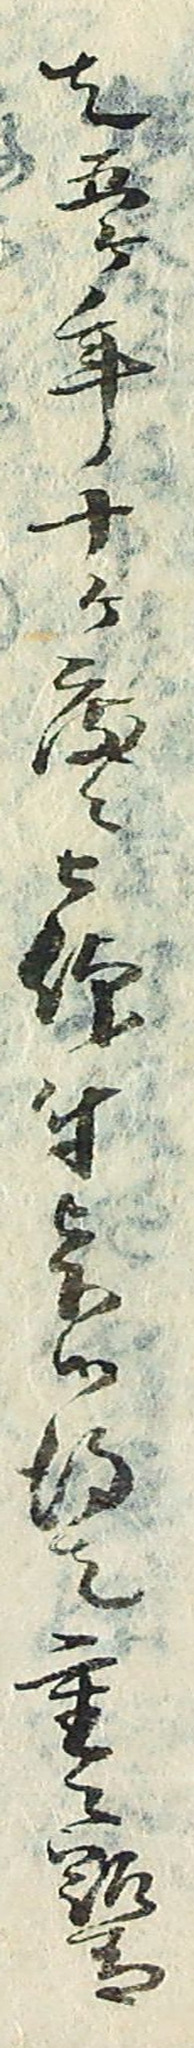者五ケ年十ケ度ニ被仰付被下候得者重々難有
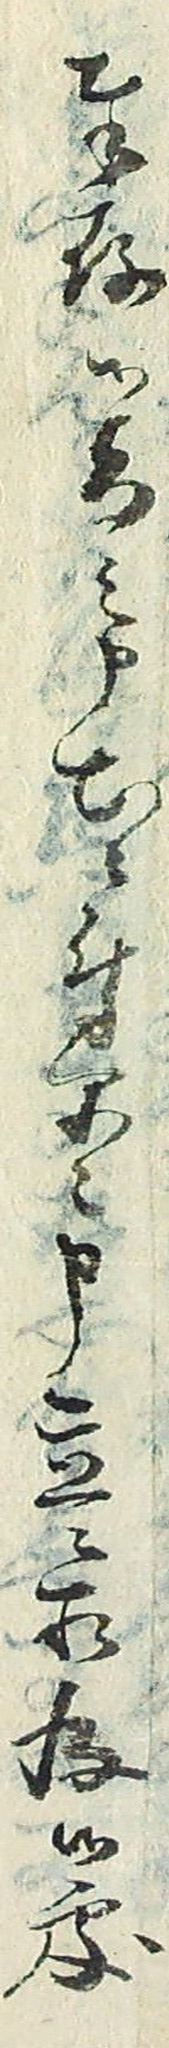奉存候旨之申出ニ付早々申立ニ相及候處
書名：諸御趣意書并御下知向之写
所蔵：鳴門教育大学 Naruto University of Education
